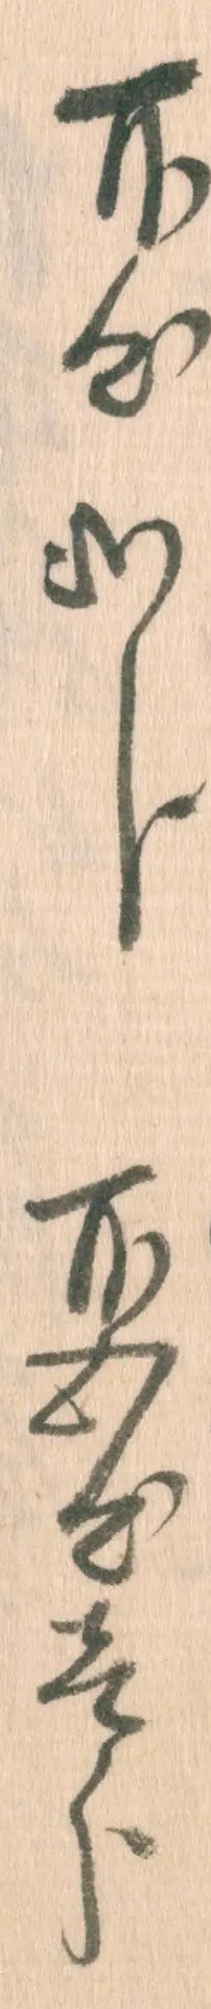廿匁弐分廿五匁壱分
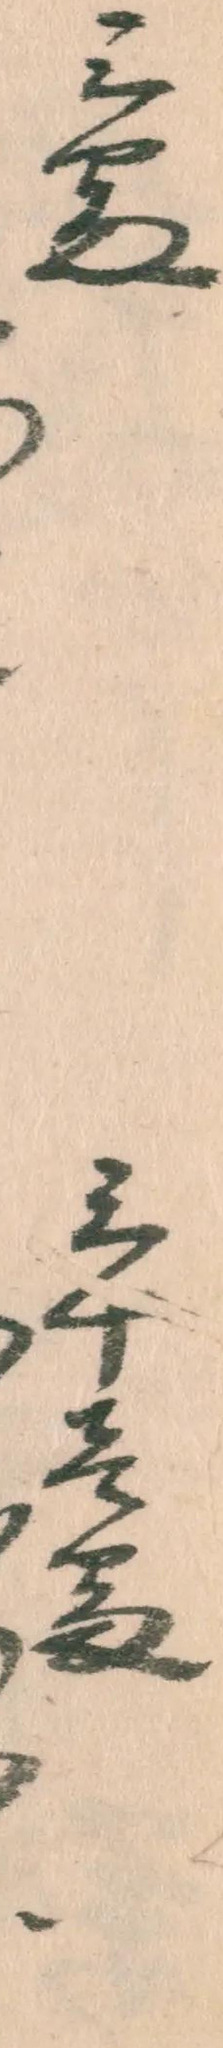三両三十壱両
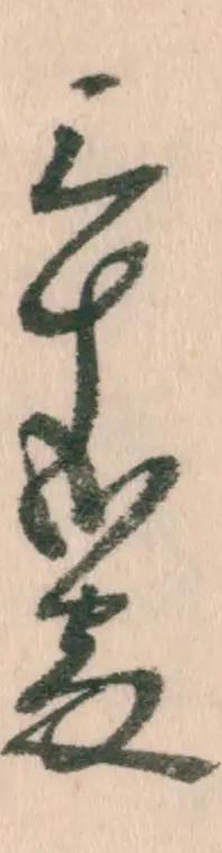三十弐両
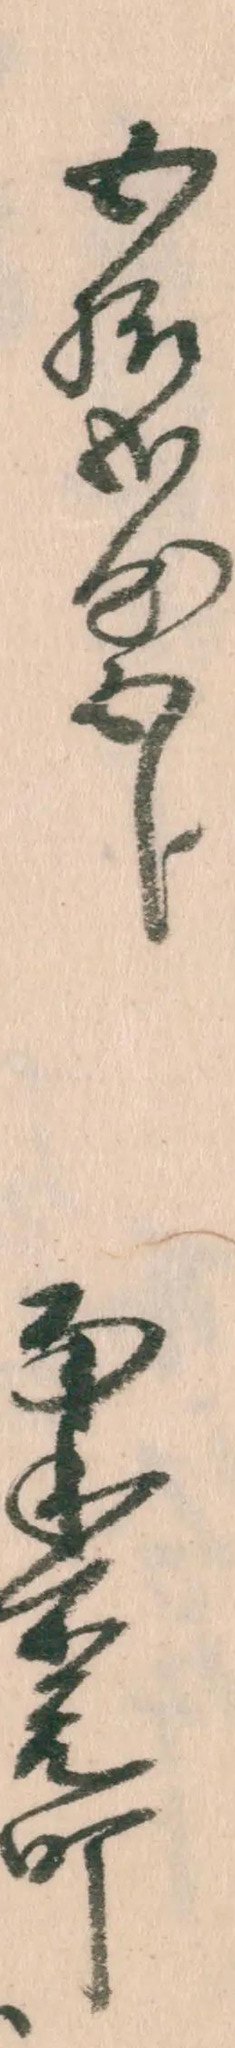五拾弐匁五分南本所元町
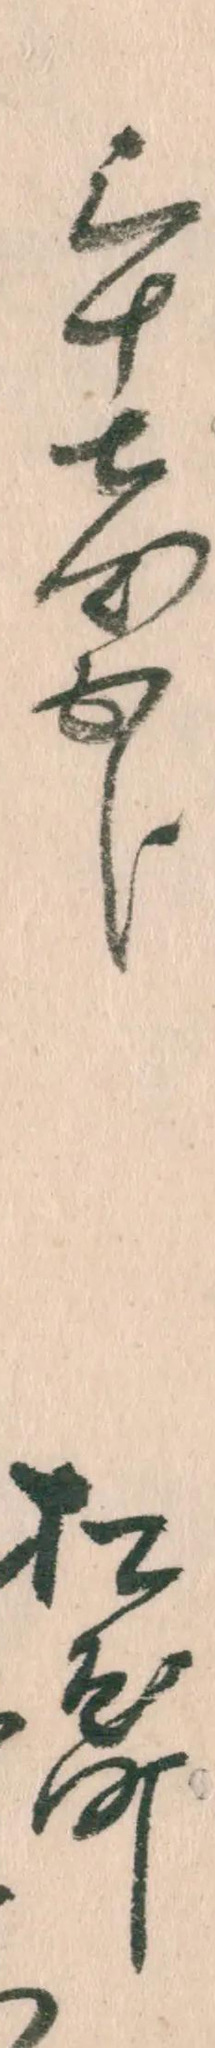三十七匁五分松屋町
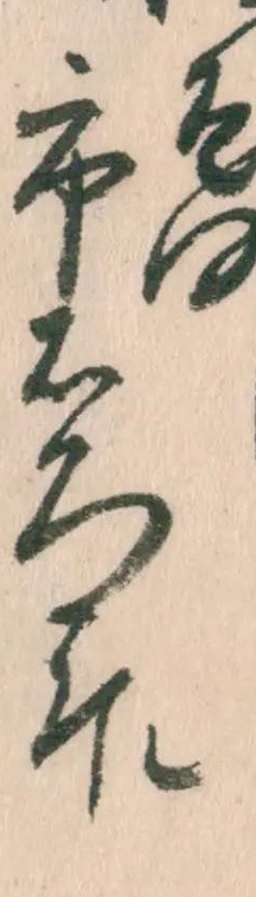徳右衛門店
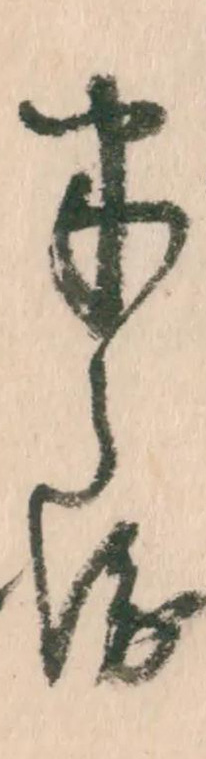惣兵衛
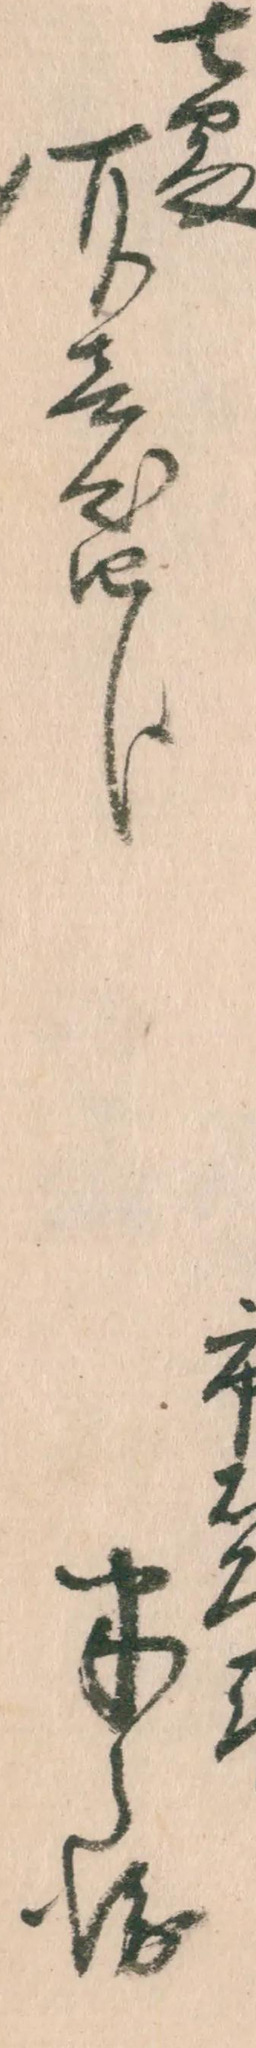廿壱匁四分半兵衛

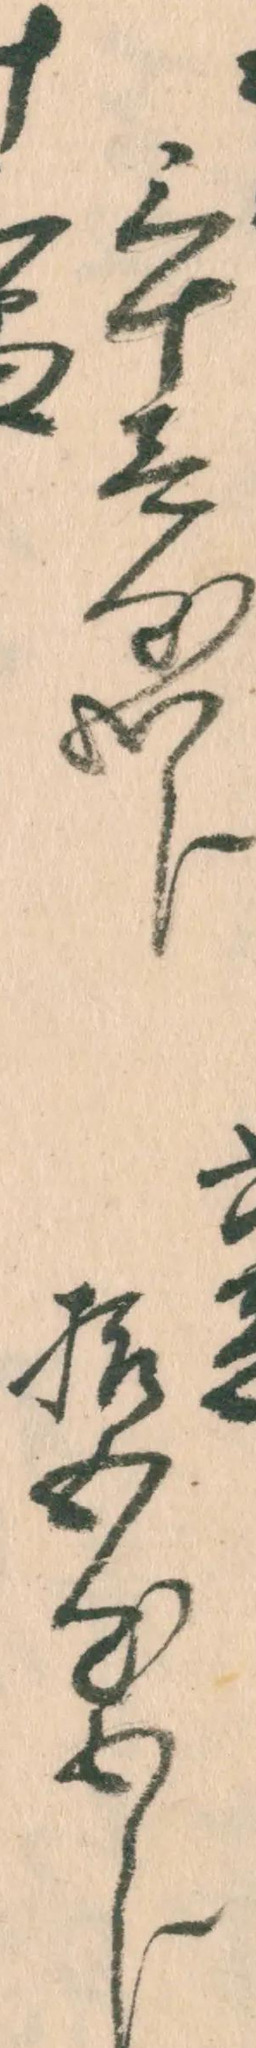三十壱匁弐分拾五匁五分
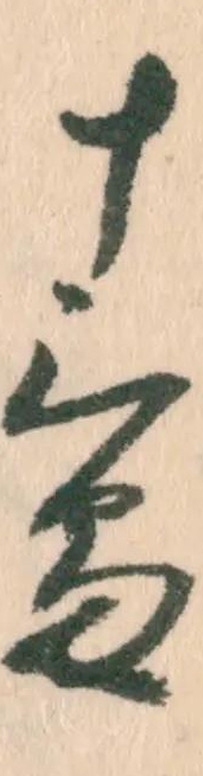十三両
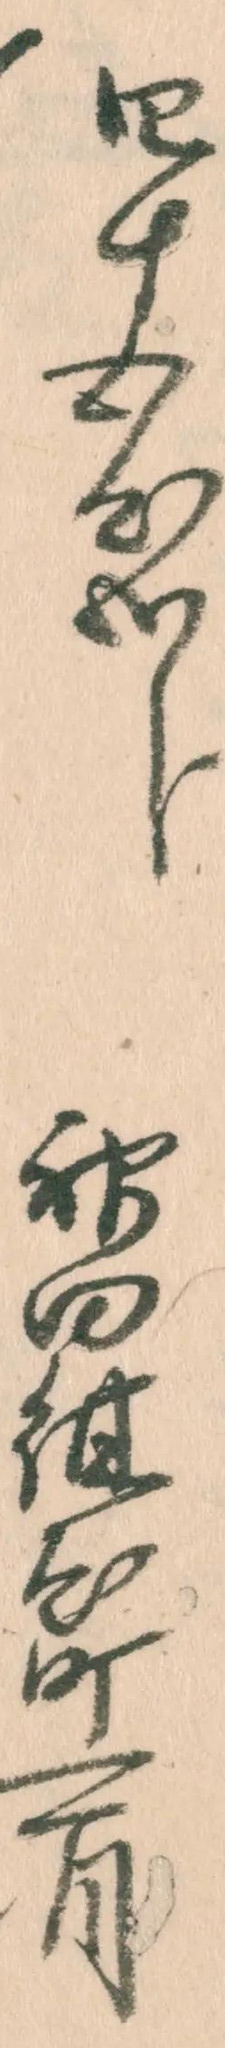四十五匁弐分神田紺屋町
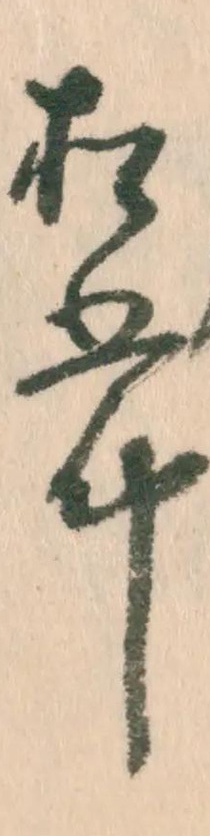松五郎
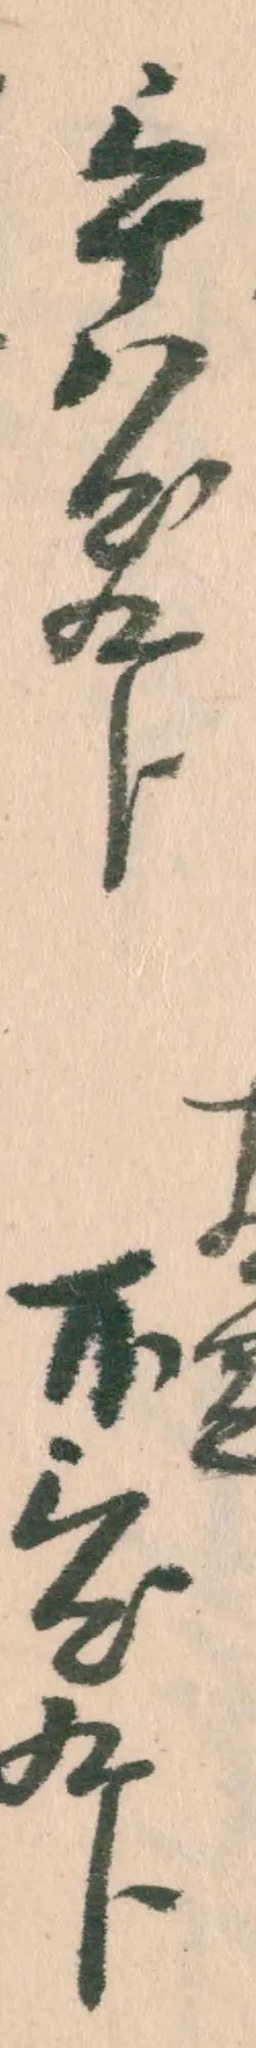三十八匁九分廿三匁九分
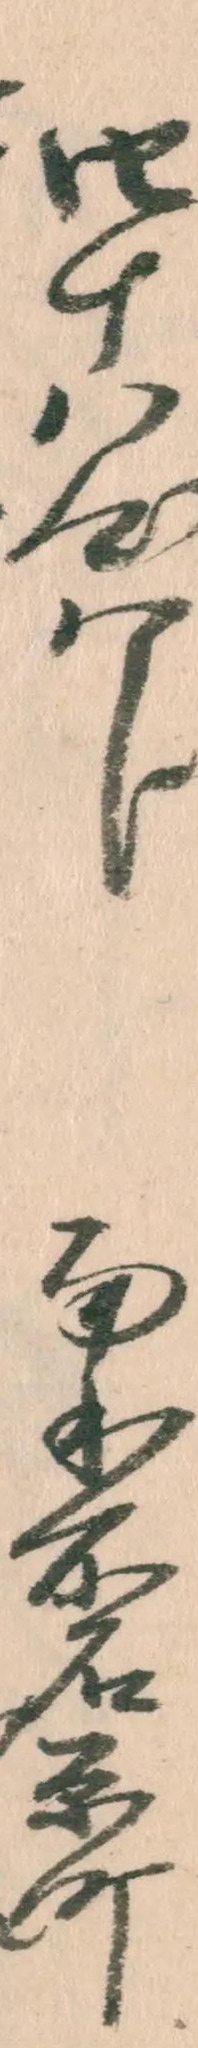四十八匁八分南本所石原町
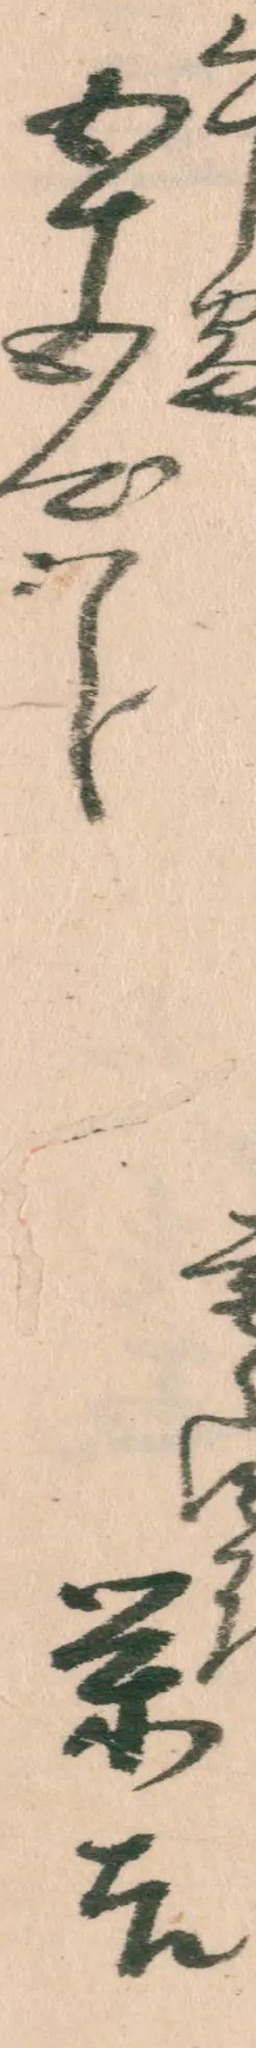五十五匁弐分栄吉
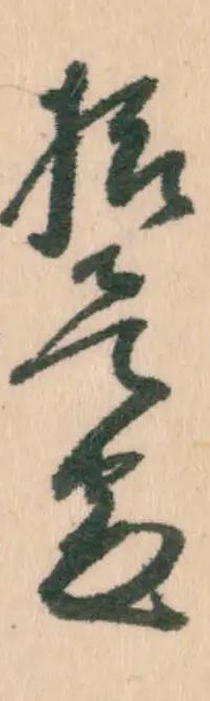拾壱両
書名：三十三間堂. [2]
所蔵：国立国会図書館 National Diet Library, JAPAN
